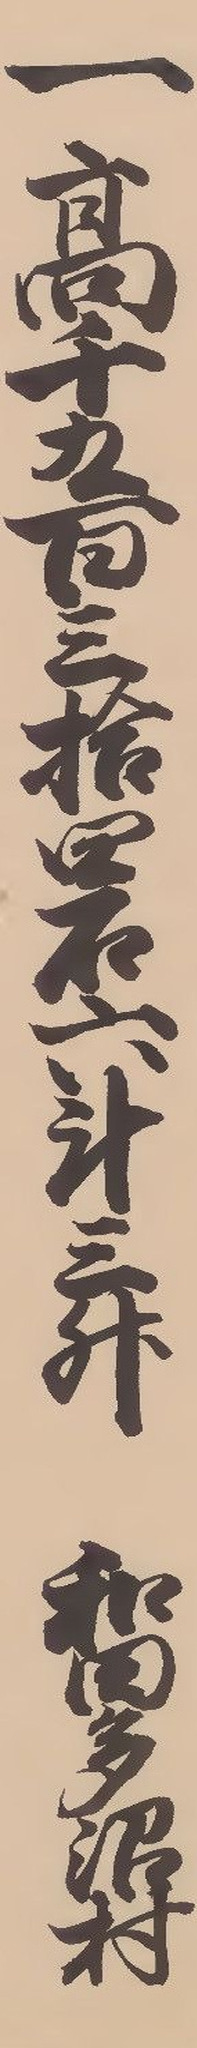一高千九百三拾四石六斗三升和田多沼村
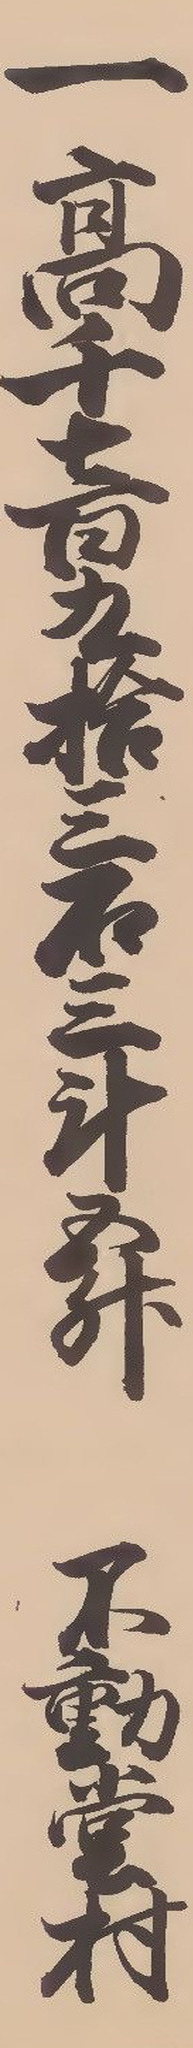一高千七百九拾三石三斗五升不動堂村
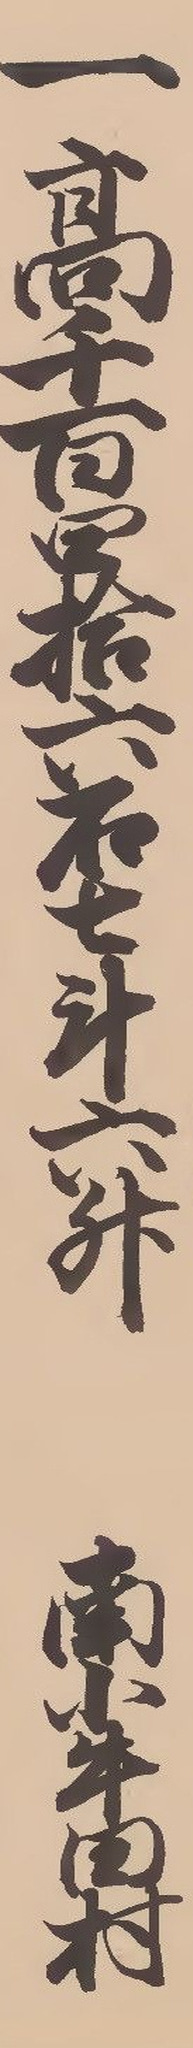一高千百四拾六石七斗六升南小牛田村
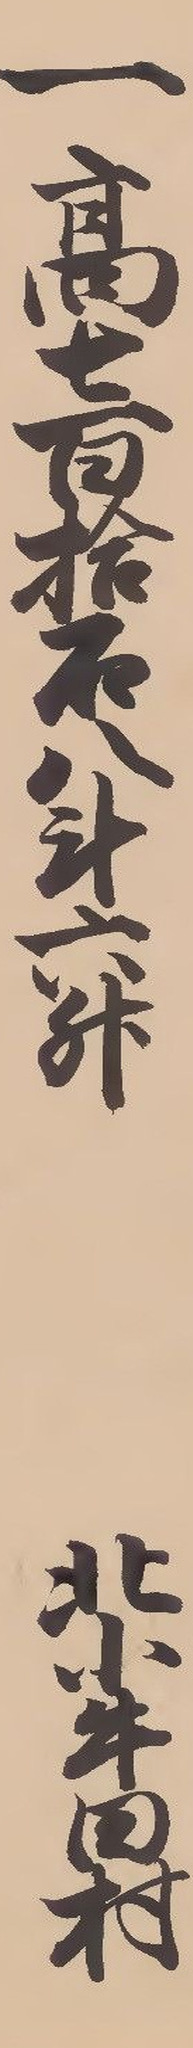一高七百拾石八斗六升北小牛田村
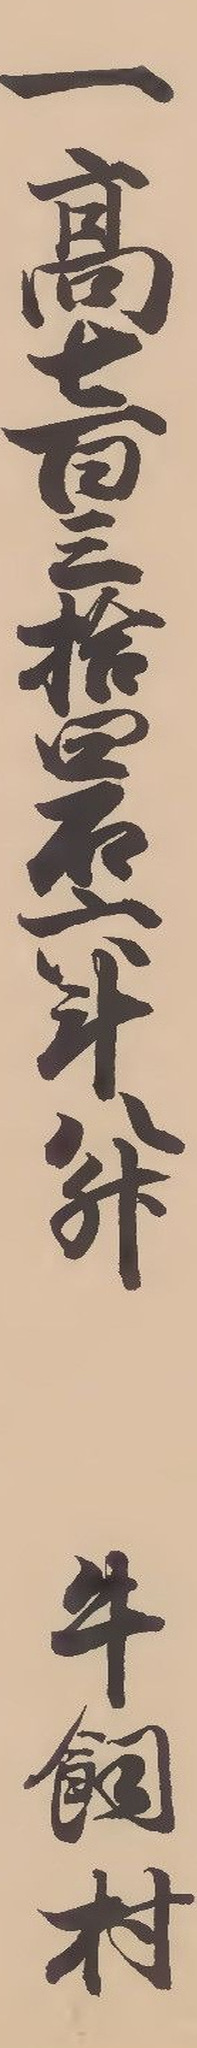一高七百三拾四石六斗八升牛飼村
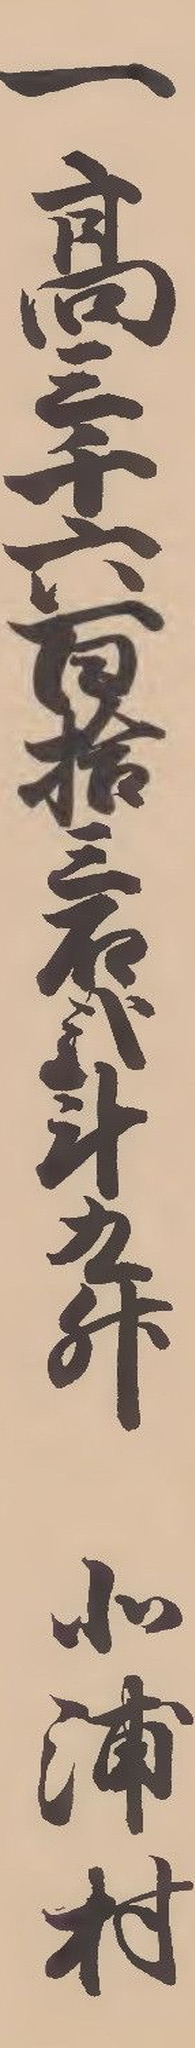一高三千六百拾三石弐斗九升北浦村
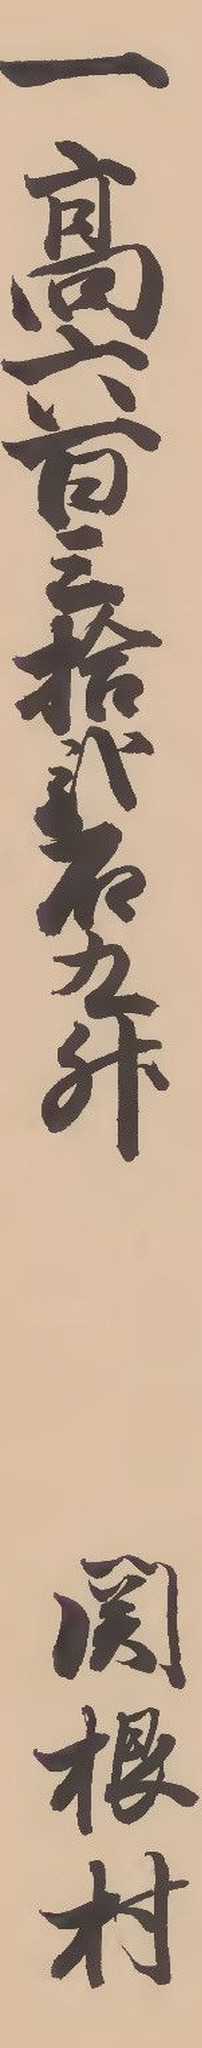一高六百三拾弐石九升関根村

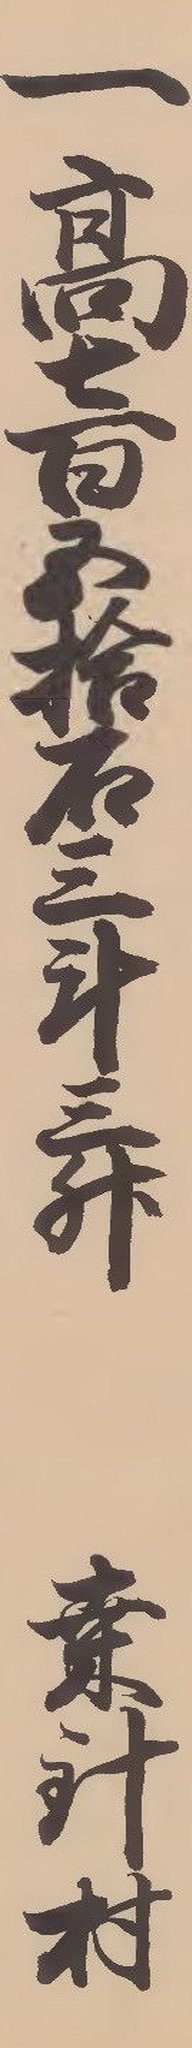一高七百五拾石三斗三升桑針村
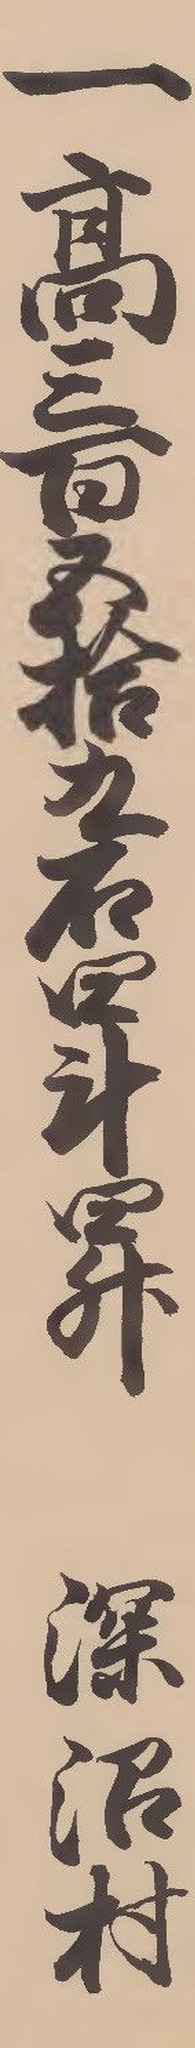一高三百五拾九石四斗四升深沼村
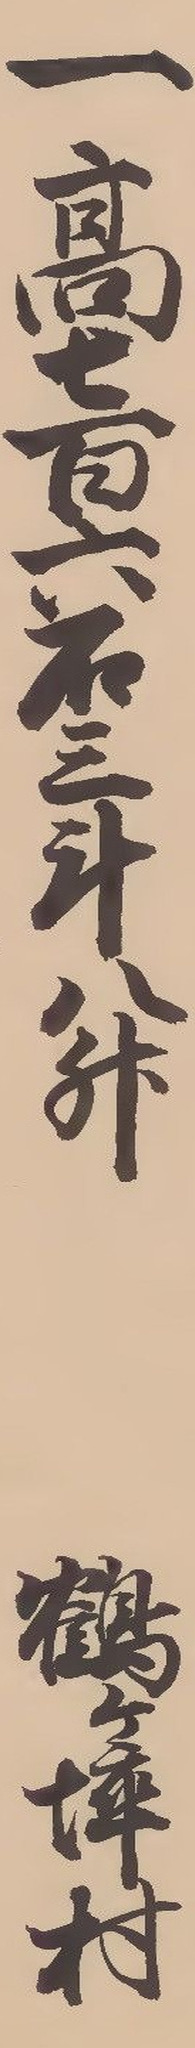一高七百六石三斗八升鶴ヶ埣村
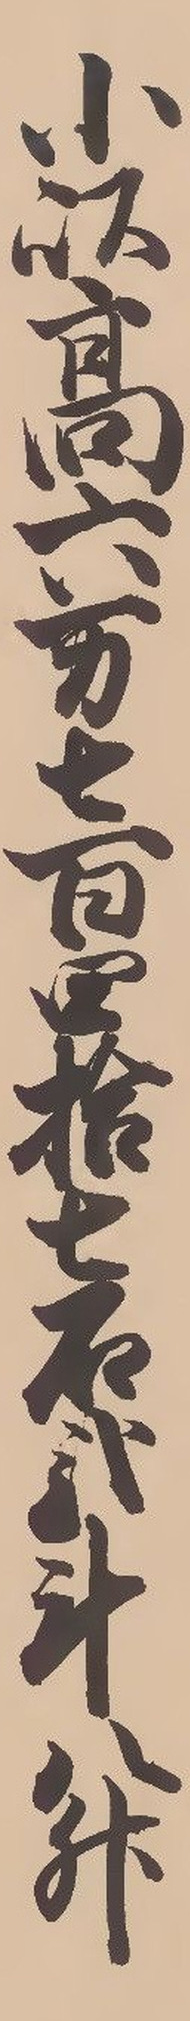小以高六万七百四拾七石弐斗八升

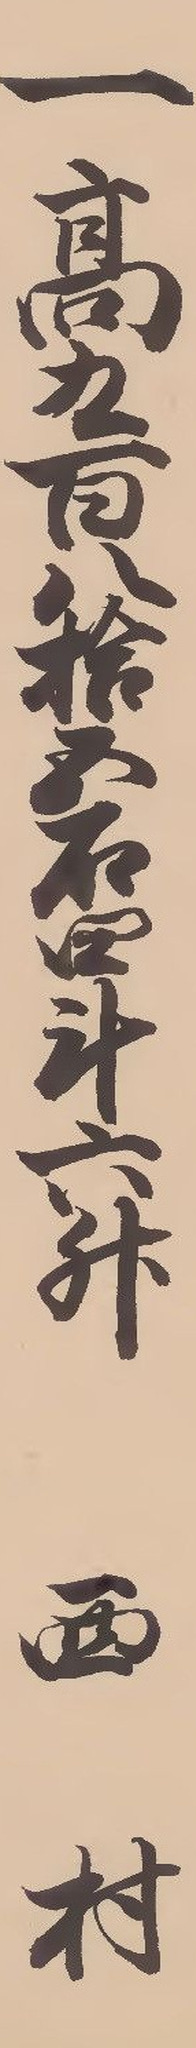一高九百八拾五石四斗六升西村
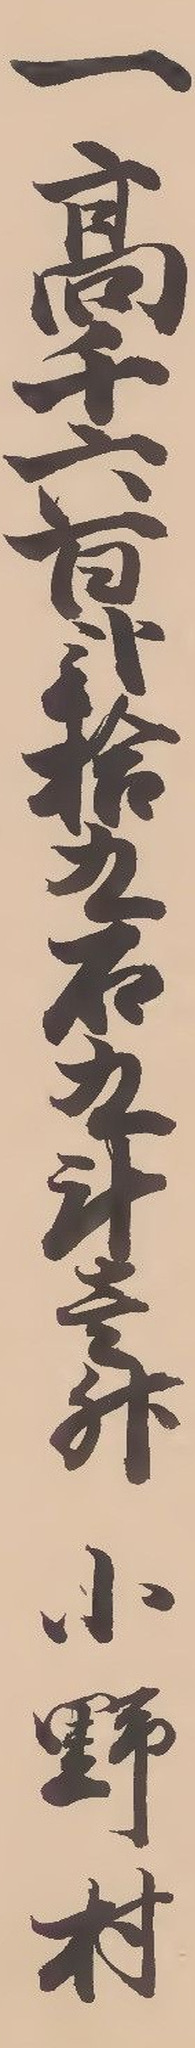一高千六百弐拾九石九斗壱升小野村
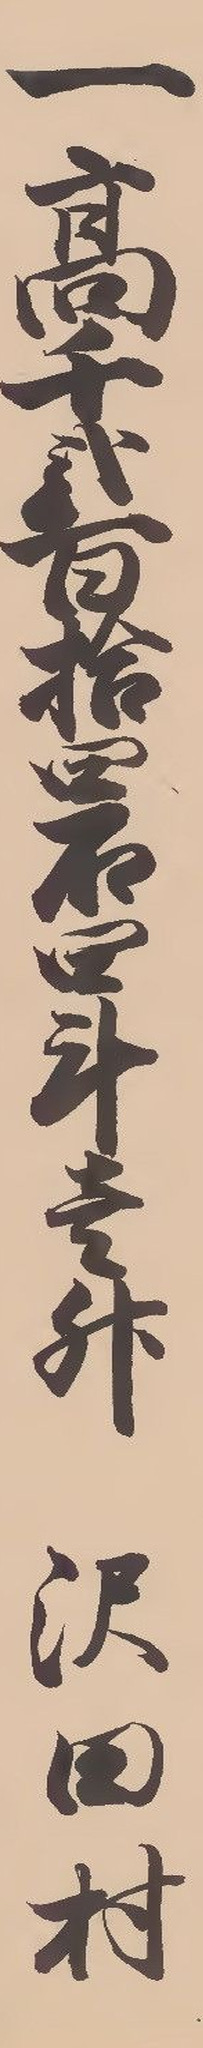一高千弐百拾四石四斗壱升沢田村
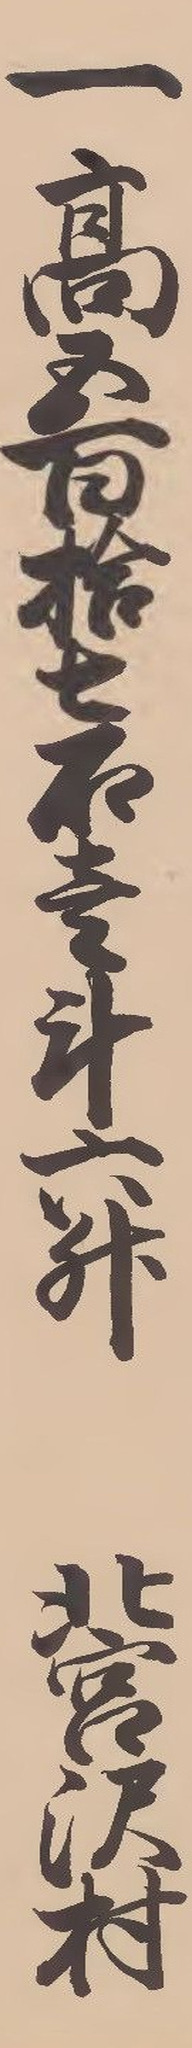一高五百拾七石壱斗六升北宮沢村
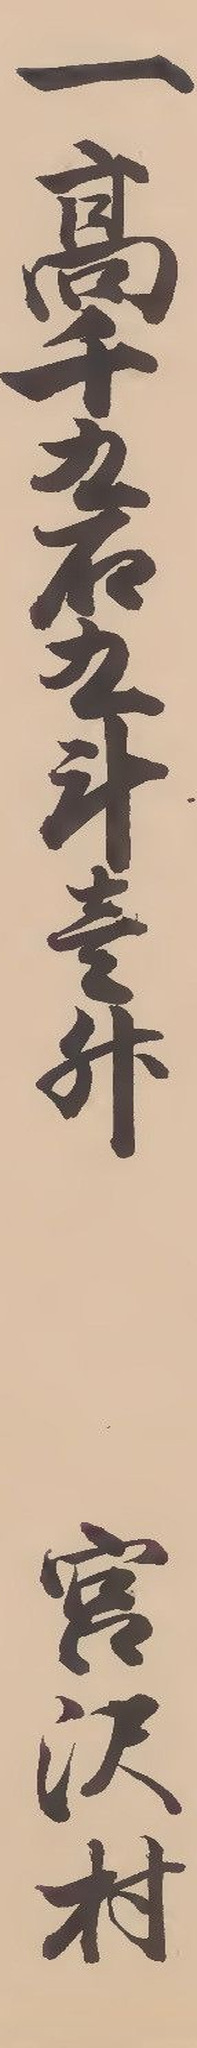一高千九石九斗壱升宮沢村
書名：陸奥国郷帳　５
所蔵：国立公文書館 National Archives of Japan
